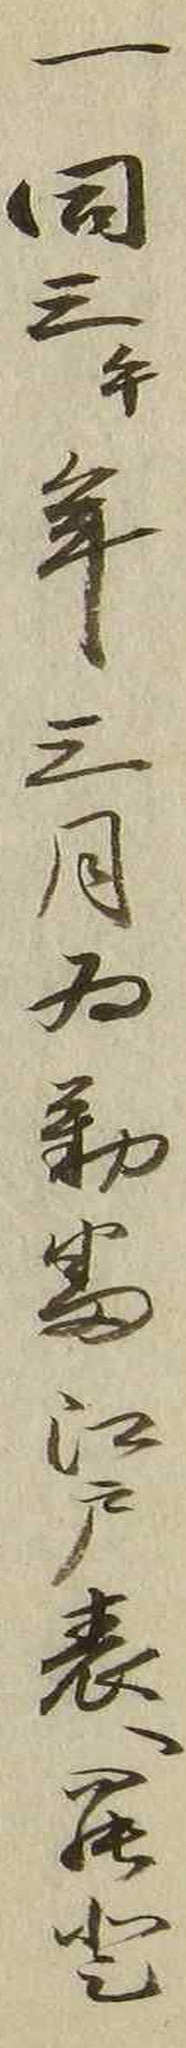一同三午年三月為勤番江戸表へ罷登
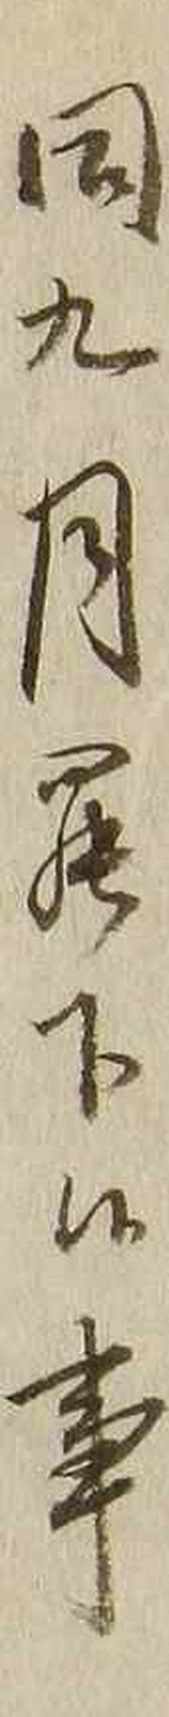同九月罷下候事
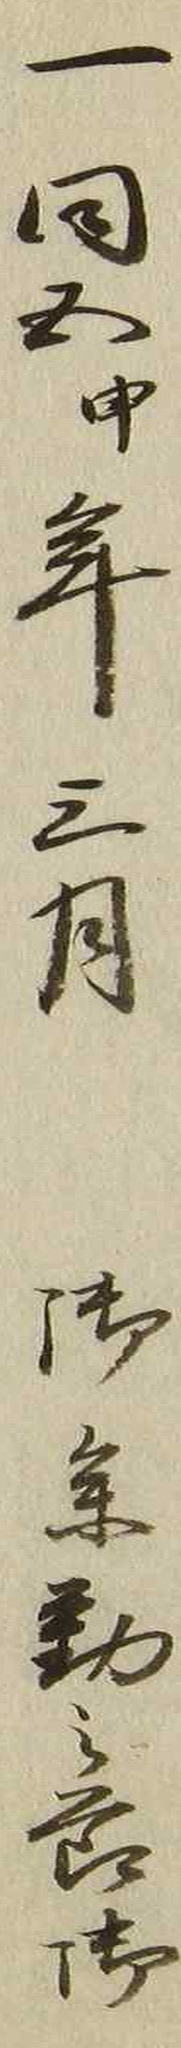一同五申年三月御参勤之節御
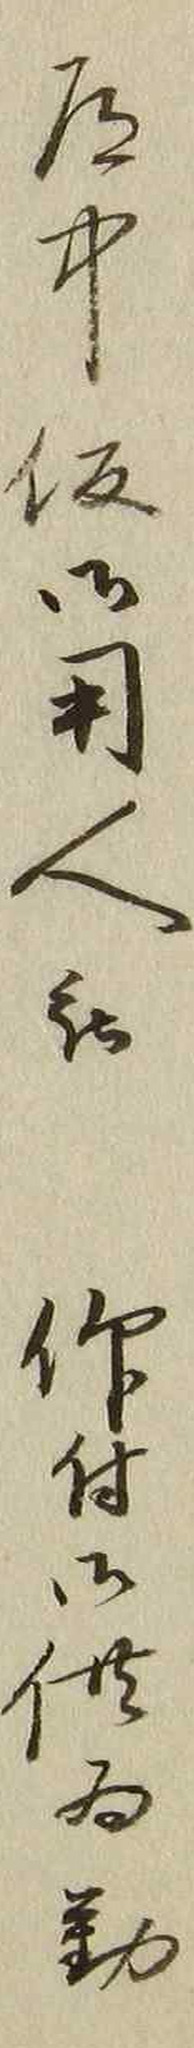道中仮御用人被仰付御供為勤
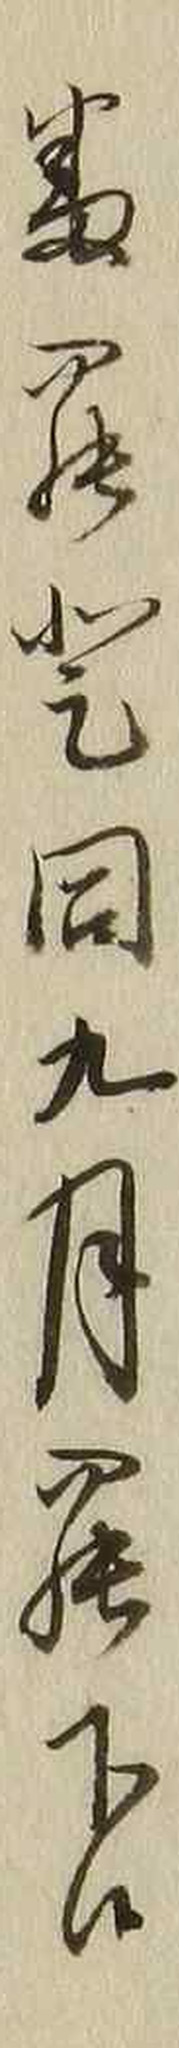番罷登同九月罷下候
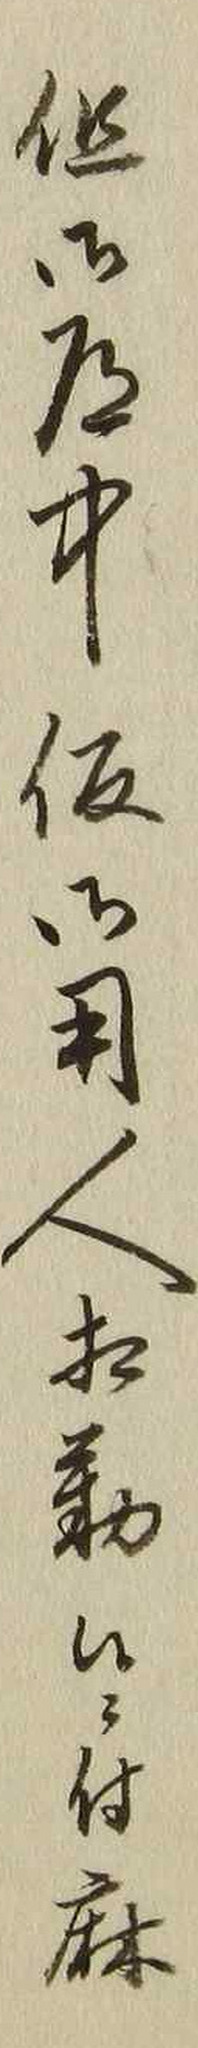但御道中仮御用人相勤候に付麻
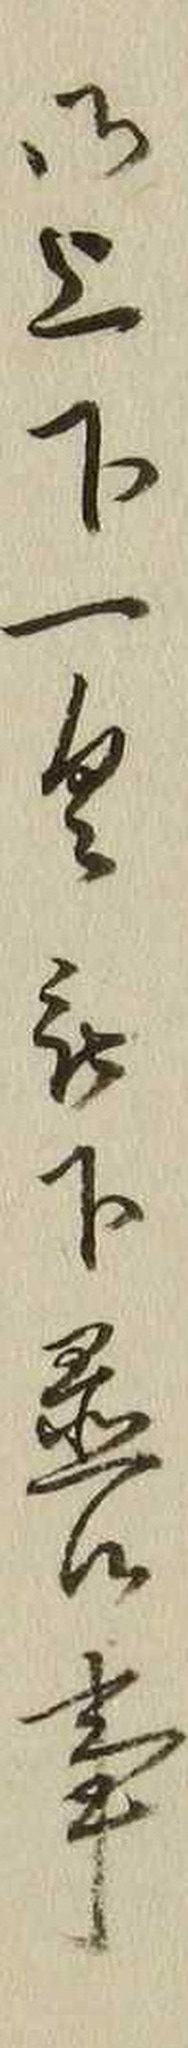御上下一具被下置候事
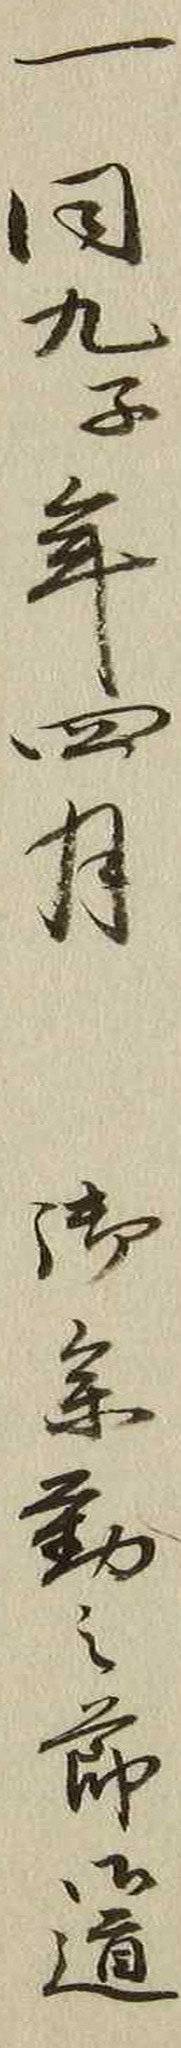一同九子年四月御参勤之節御道
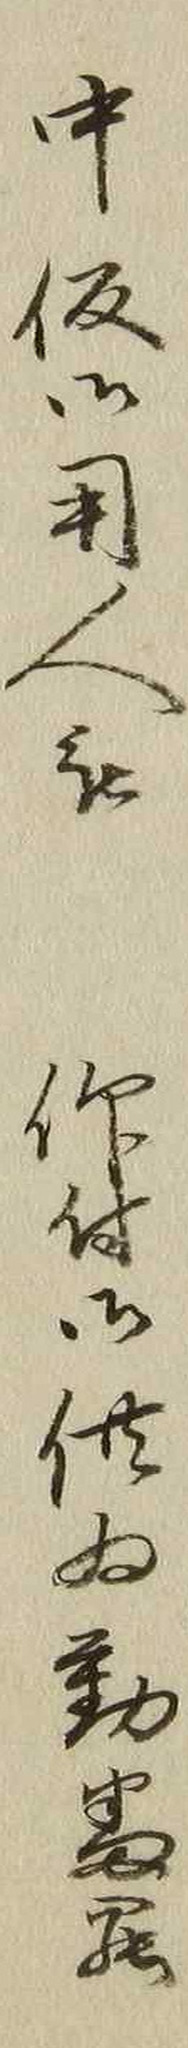中仮御用人被仰付御供為勤番罷
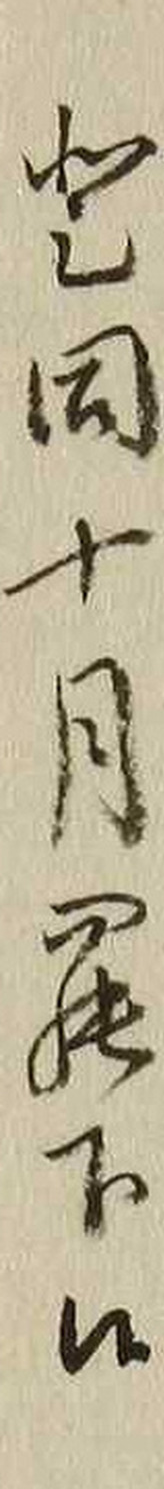登同十月罷下候
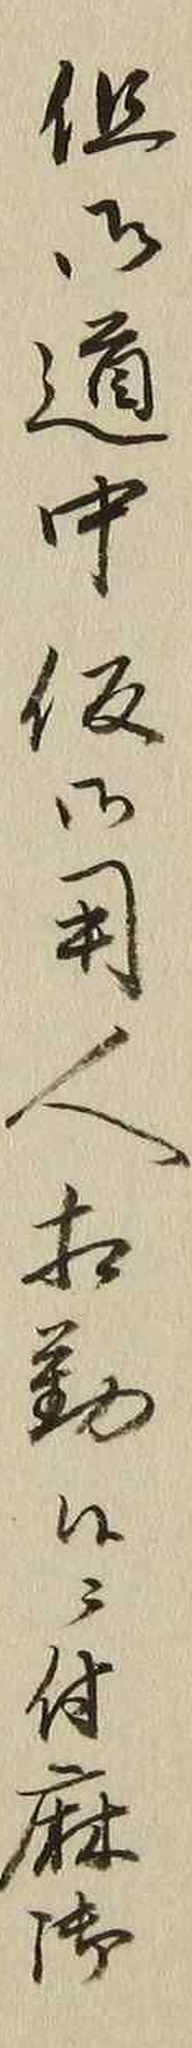但御道中仮御用人相勤候に付麻御
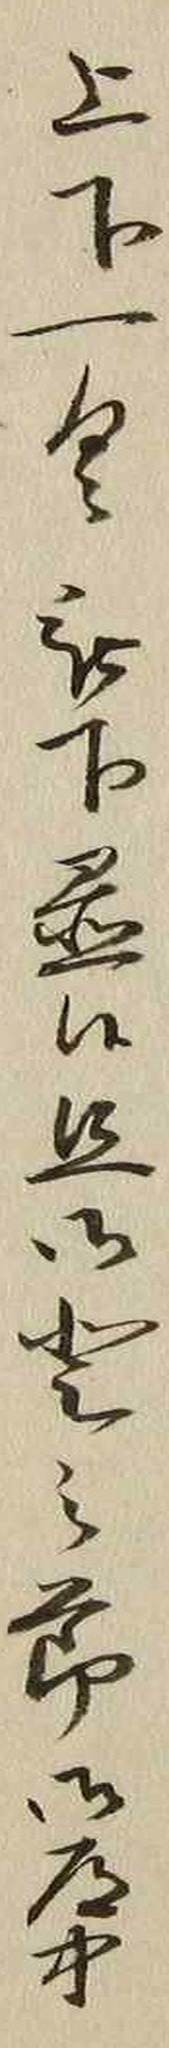上下一具被下置候且御登之節御道中
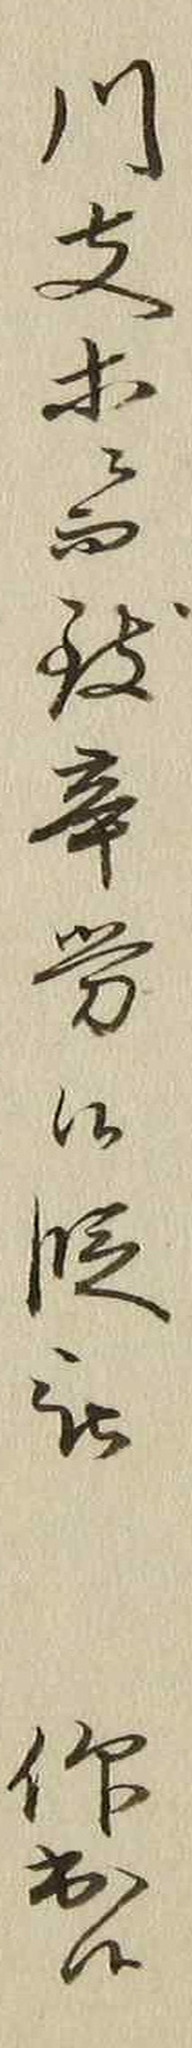川支等に而致辛労候段被仰出候
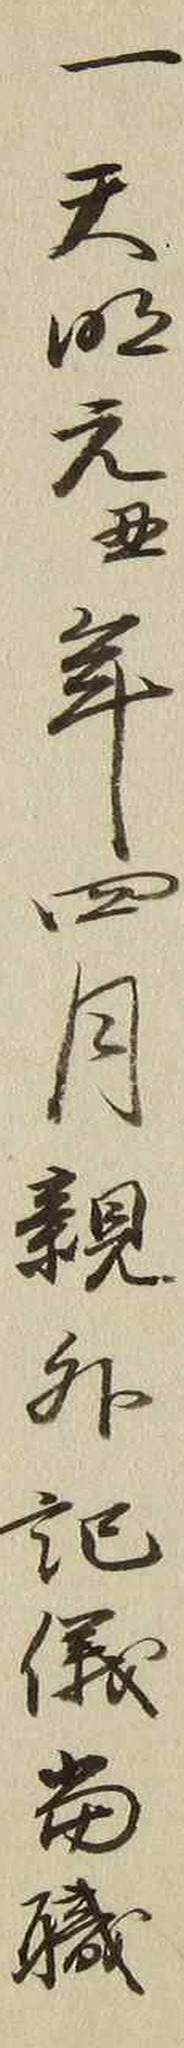一天明元丑年四月親外記儀当職
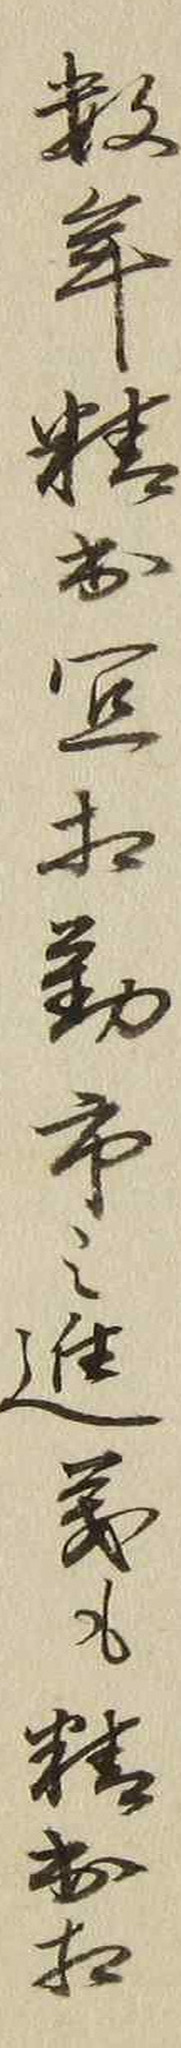数年精出宜相勤市之進義も精出相
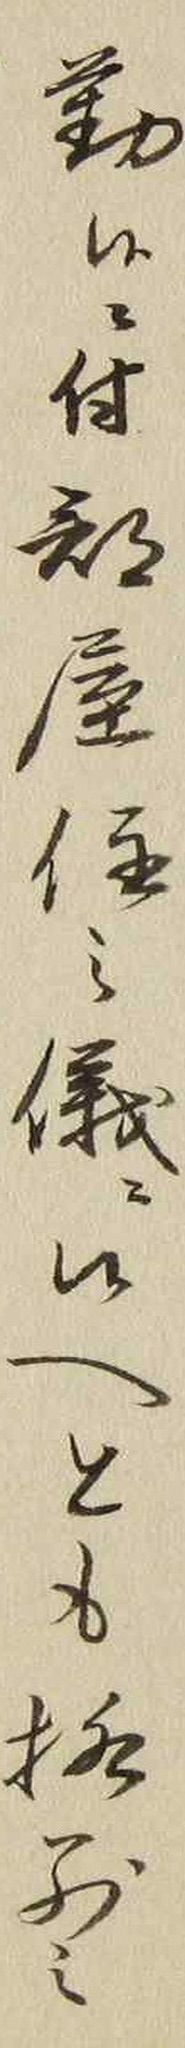勤候に付部屋住之儀に候へとも格別之
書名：諸士系譜　巻之133　た之部9
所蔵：会津若松市立会津図書館
